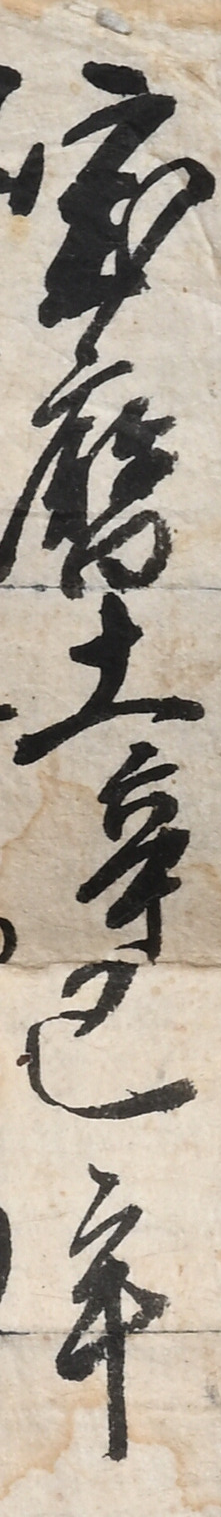宝暦十一辛巳年
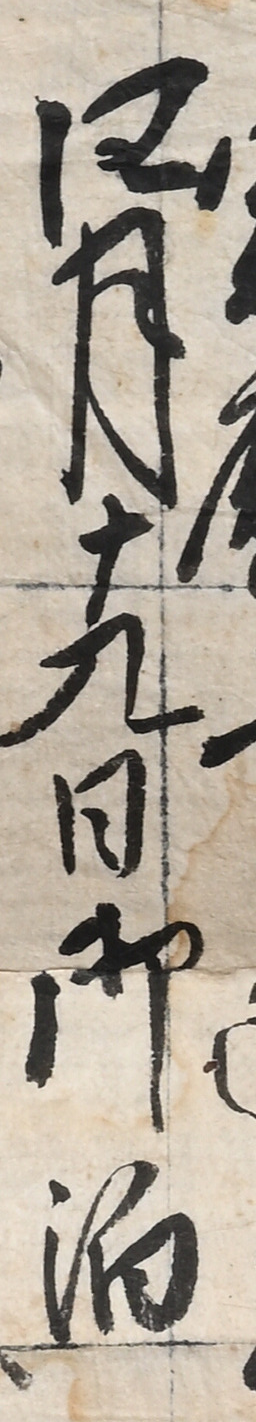四月十九日御泊
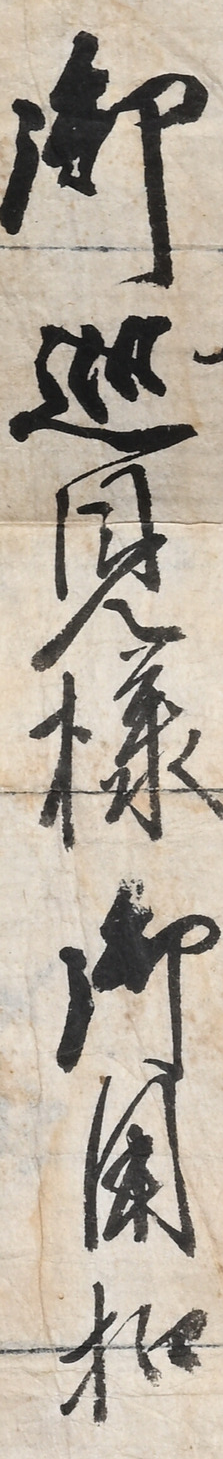御巡見様御用扣

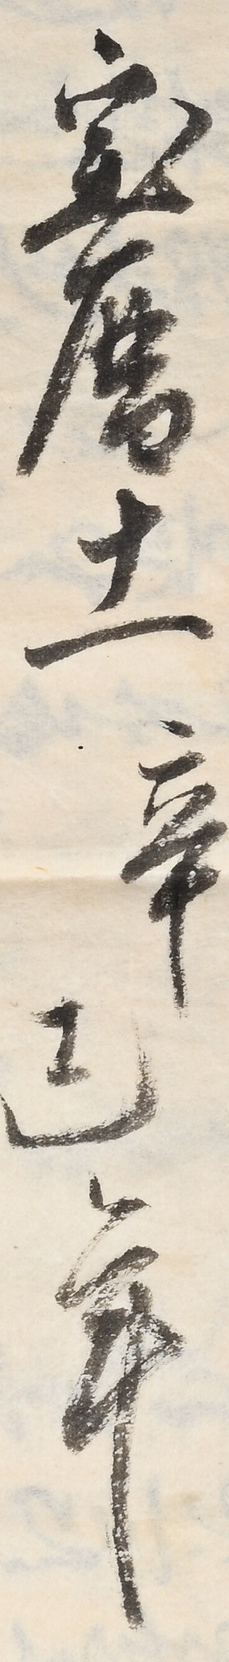宝暦十一辛巳年
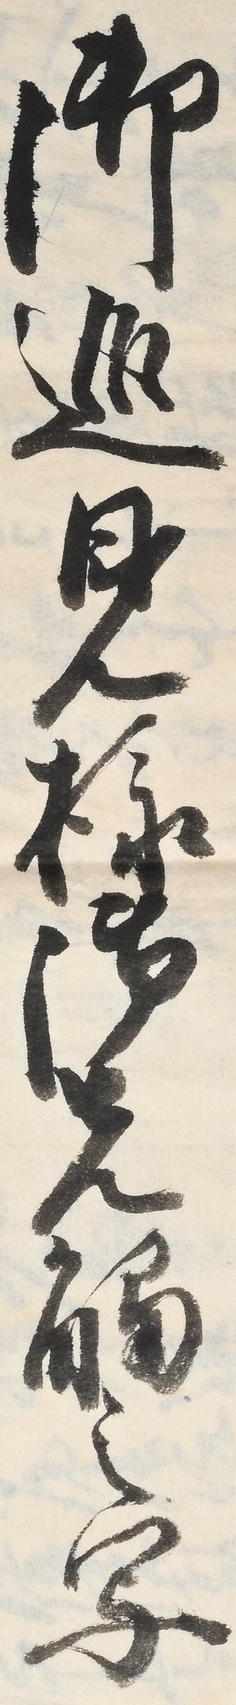御巡見様御先触之写
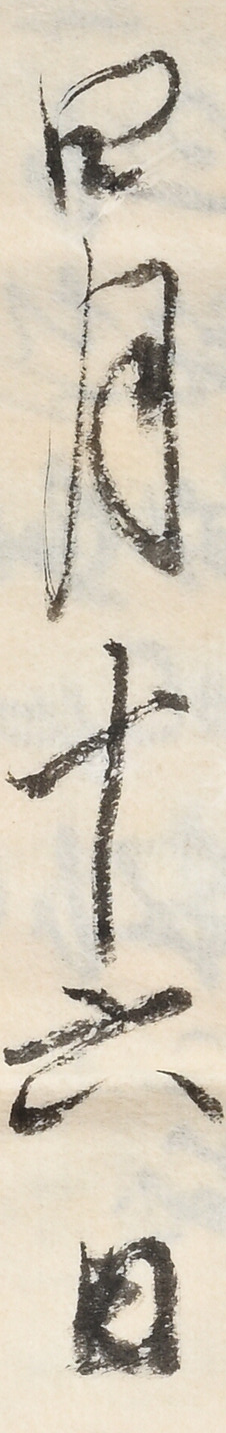四月十六日

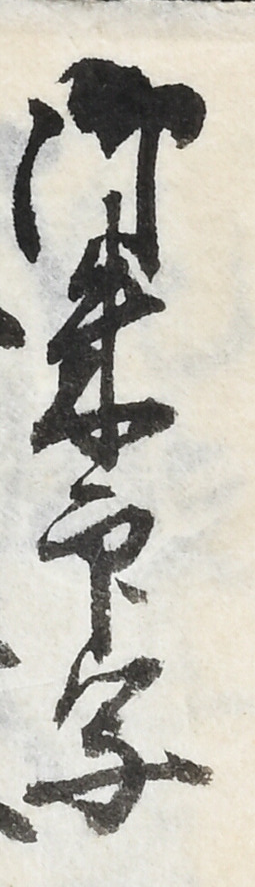御朱印写
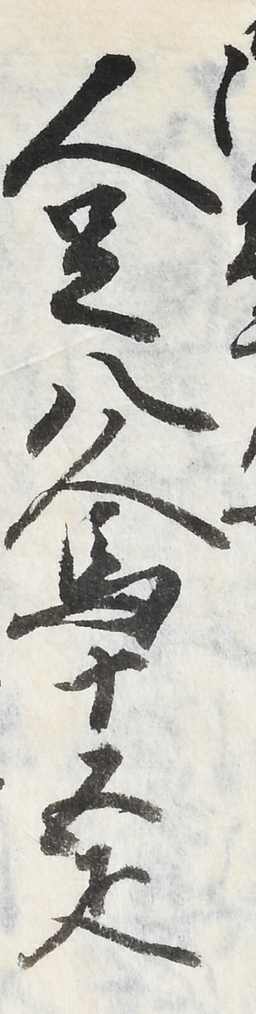人足八人、馬十五疋

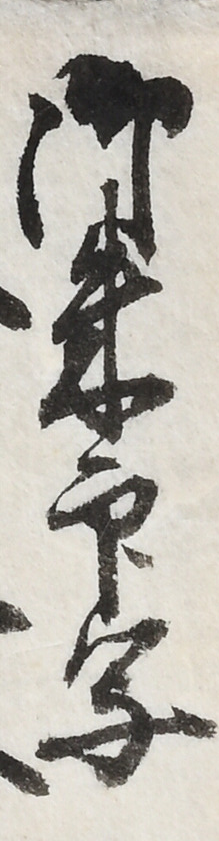御朱印写
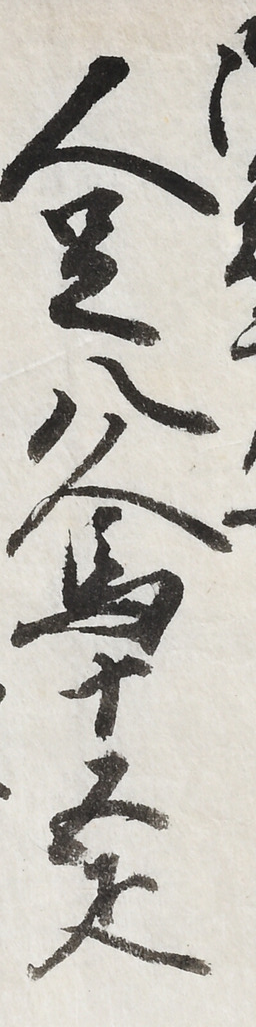人足八人馬十五疋
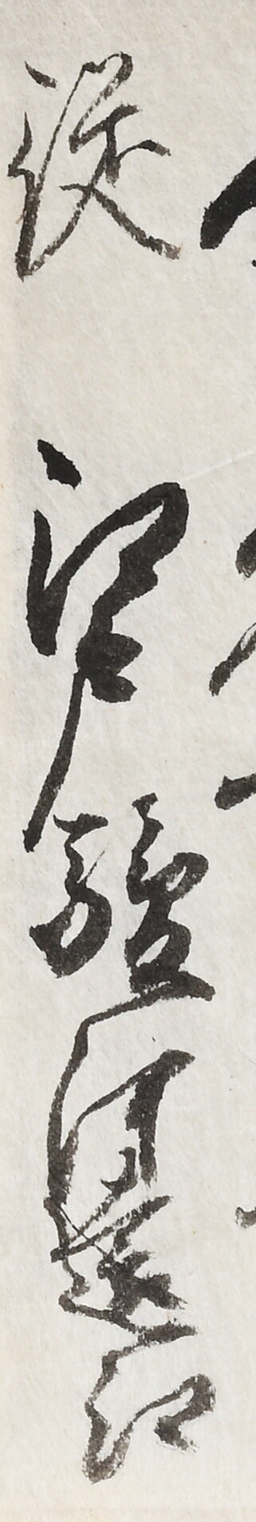従江戸駿河遠江
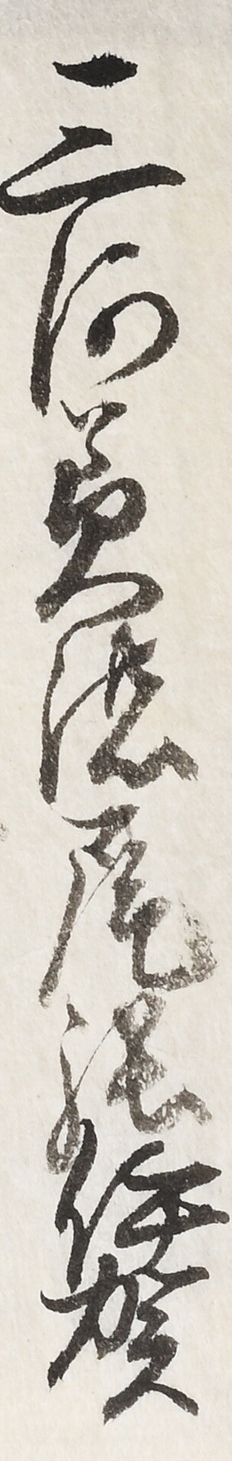三河美濃尾張伊賀
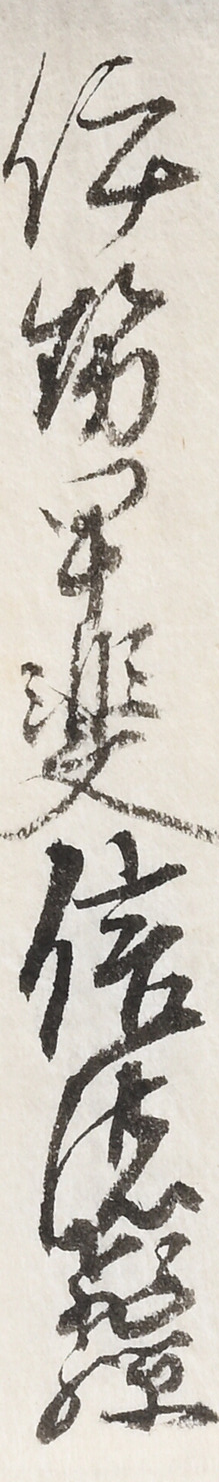伊勢甲斐信濃飛騨
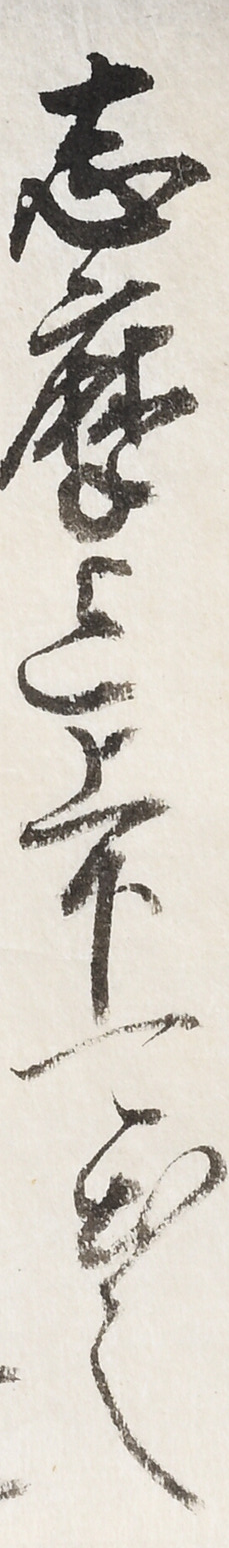志摩迄上下可出之
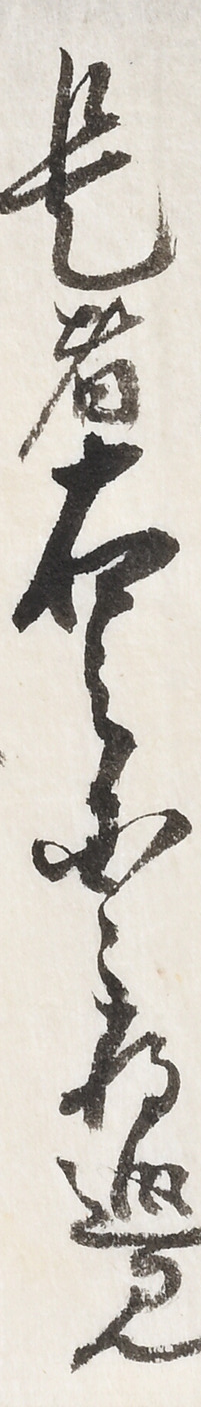是者右之国々為巡見
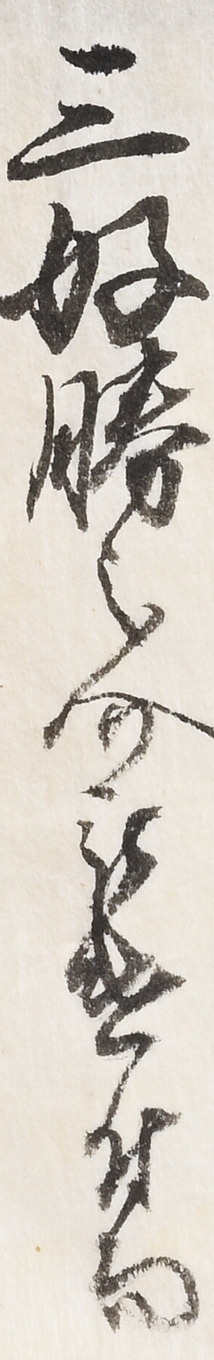三好勝之介被遣付而
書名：御巡見様御先觸之写
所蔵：伊那市立高遠町図書館・合同会社AMANE
